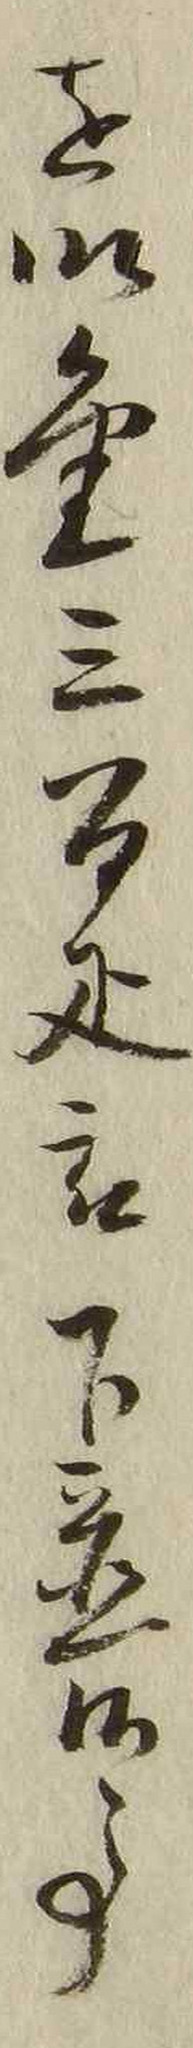を以金三百疋被下置候事
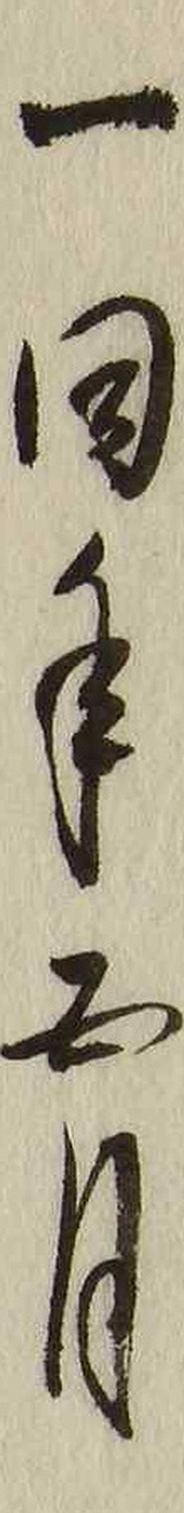一同年五月
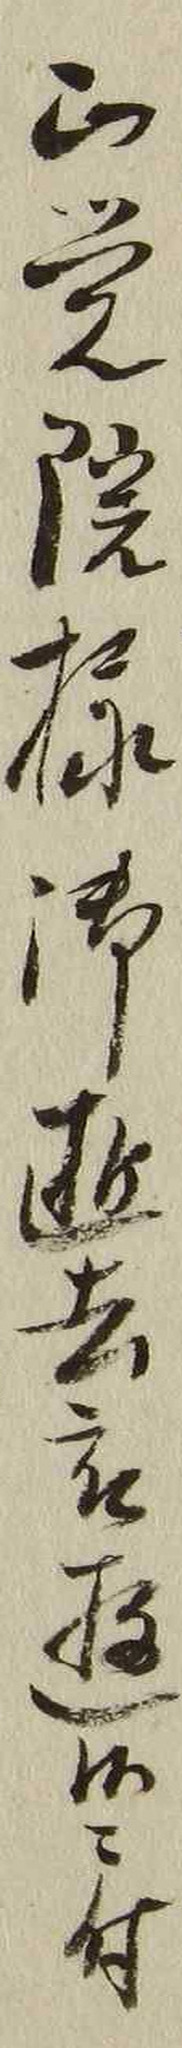正覚院様御逝去被遊候ニ付
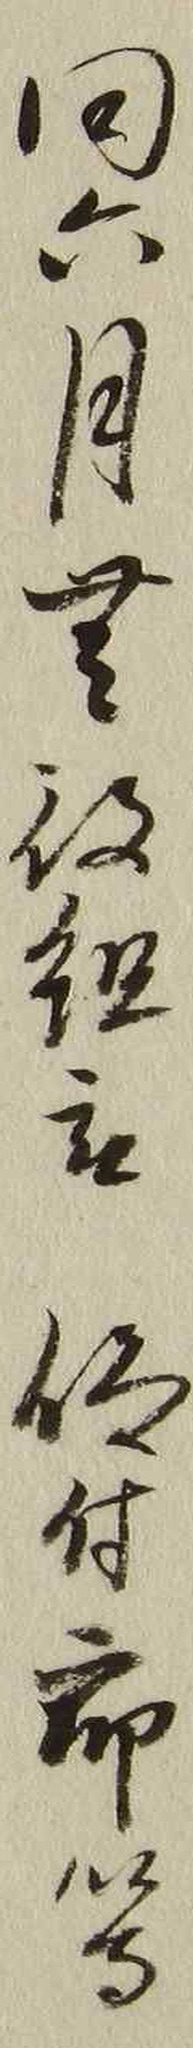同六月無役組被仰付郎等
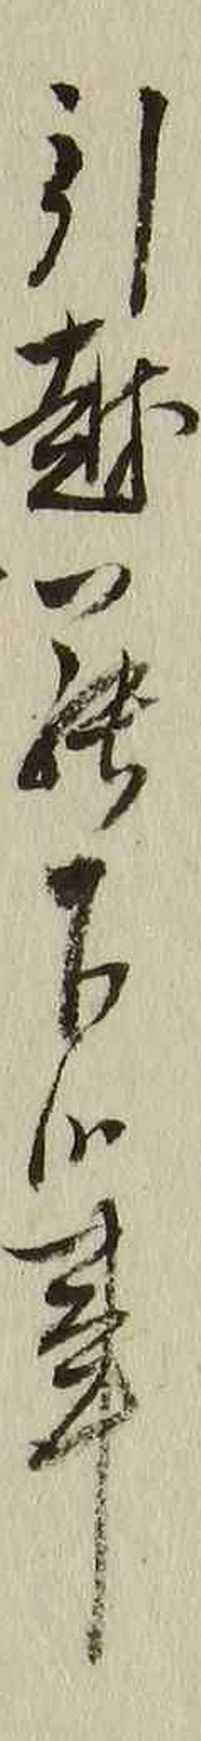引越罷下候事
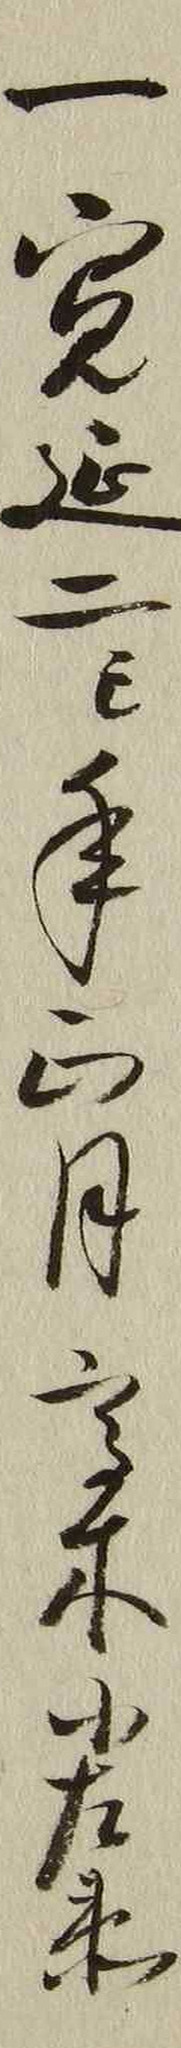一寛延二巳正月高木小左衛
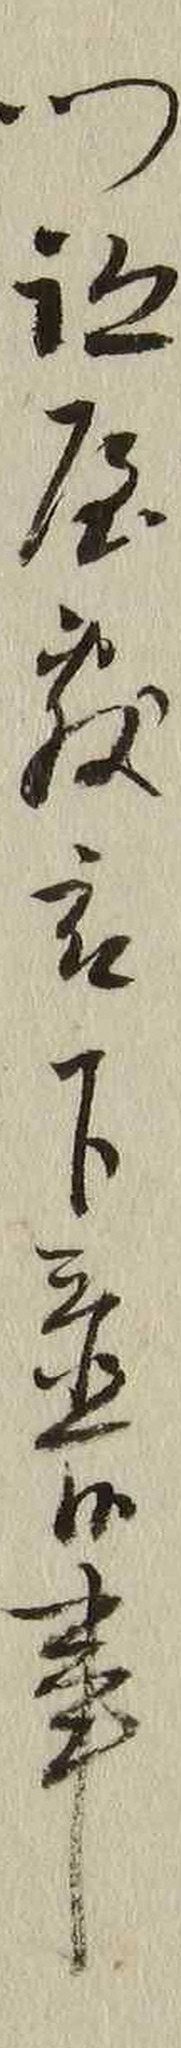門跡屋敷被下置候事
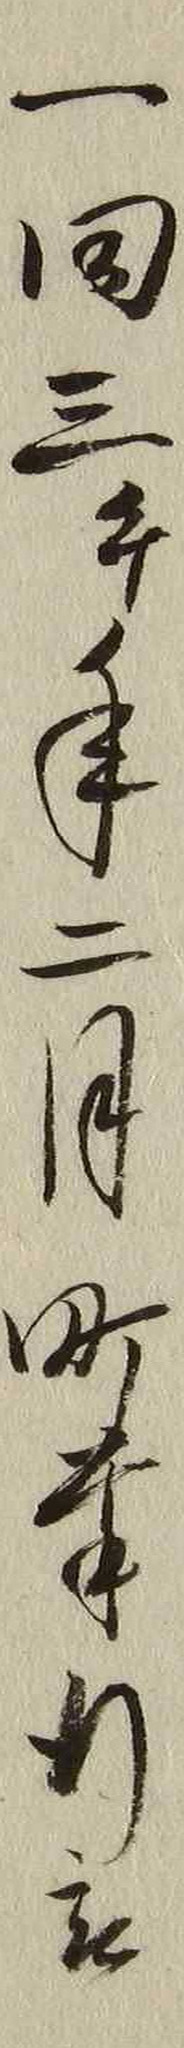一同三午年二月町奉行被
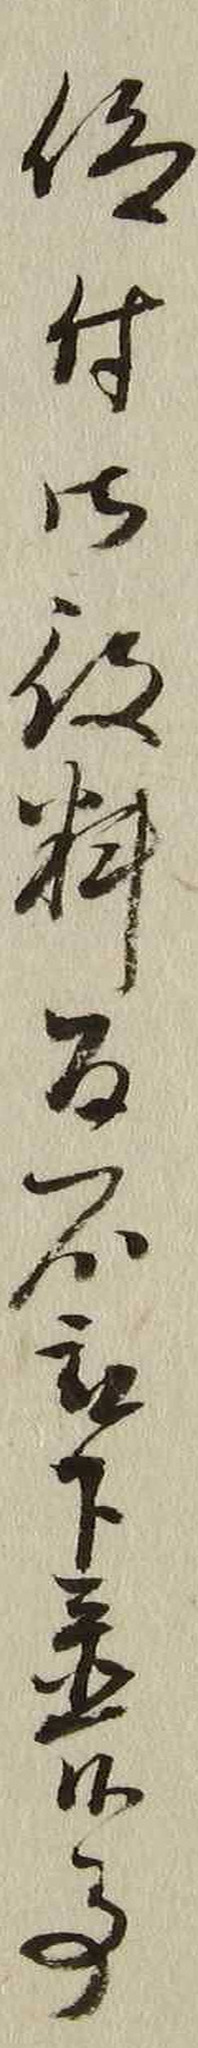仰付御役料百石被下置候事
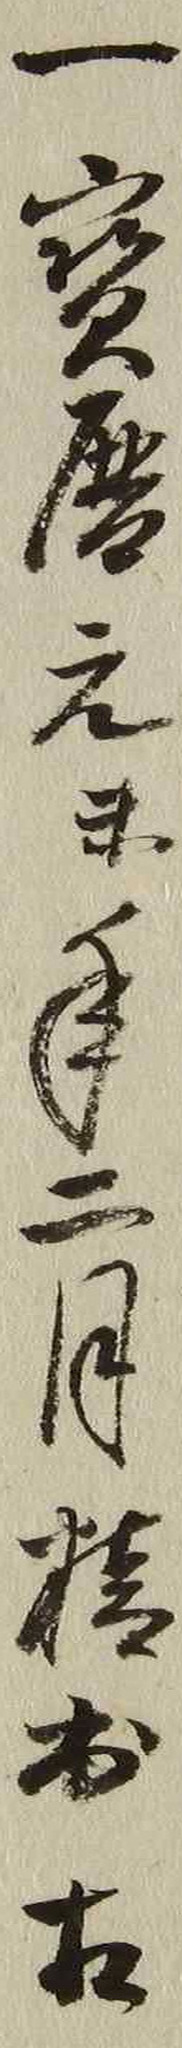一宝暦元未年二月精出相
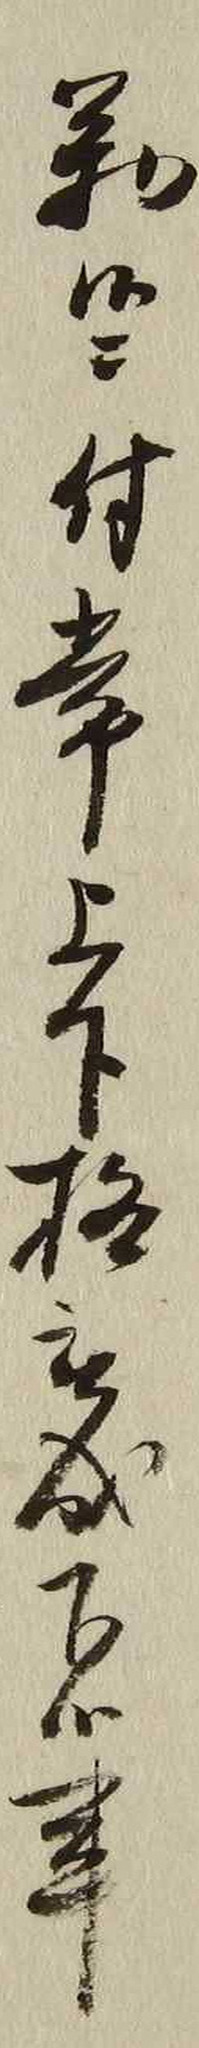勤候ニ付常上下格被成下候事
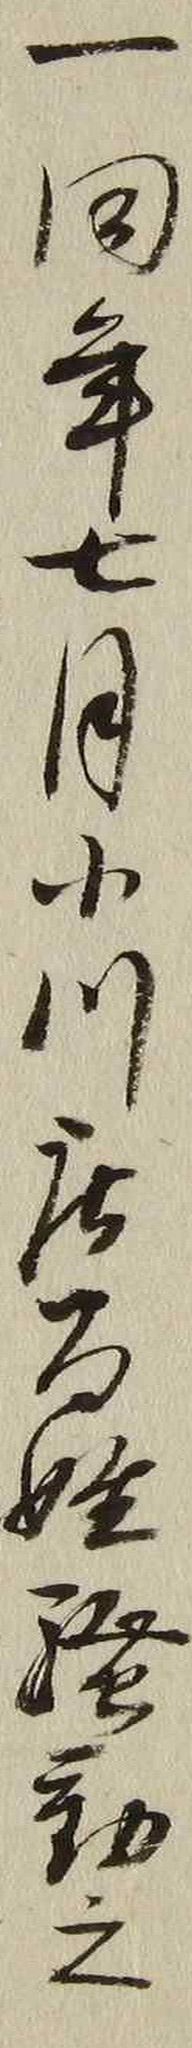一同年七月小川庄百姓騒動之
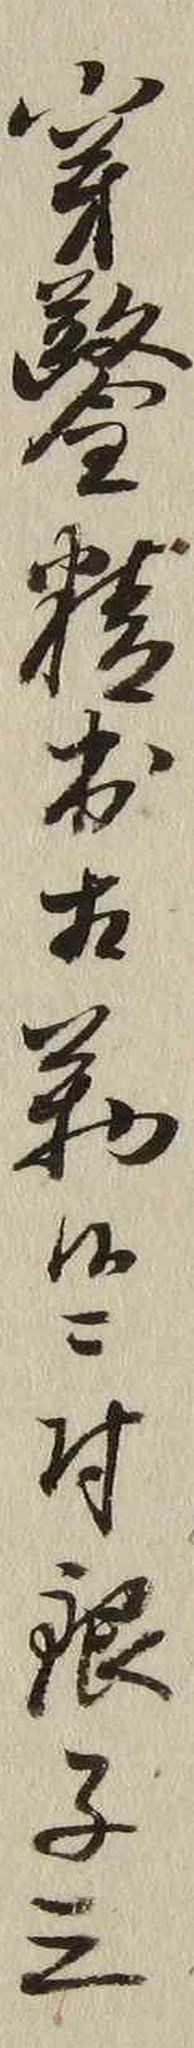穿鑿精出相勤候ニ付銀子三
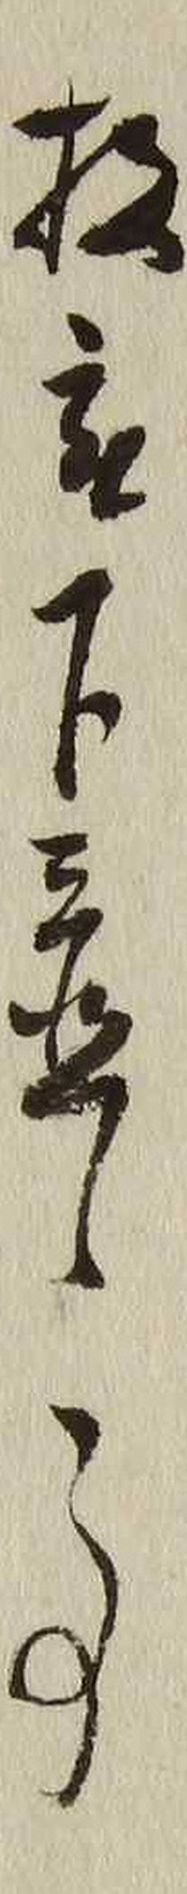枚被下置候事
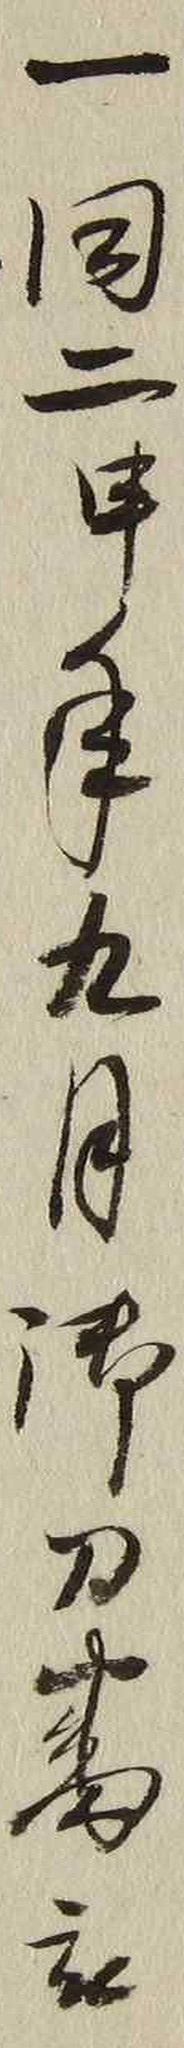一同二申年九月御刀番被
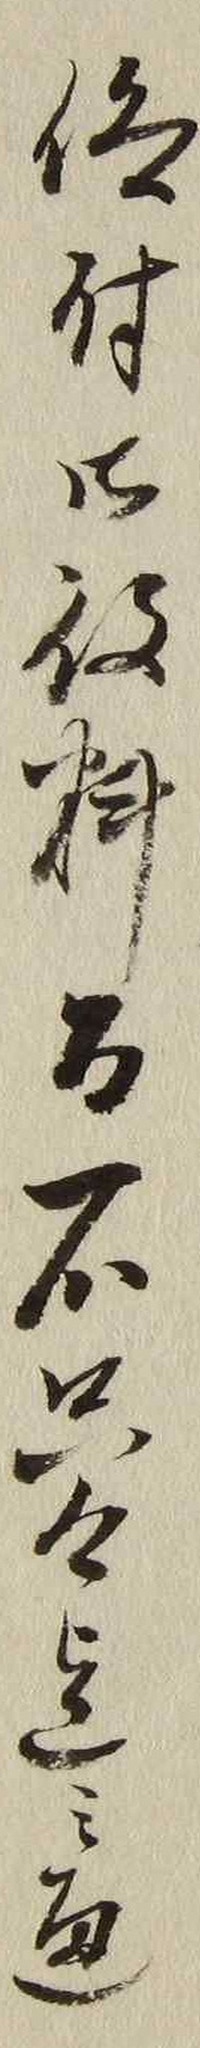仰付御役料百石只今迄之通
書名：諸士系譜　巻之355　す之部5
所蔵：会津若松市立会津図書館
